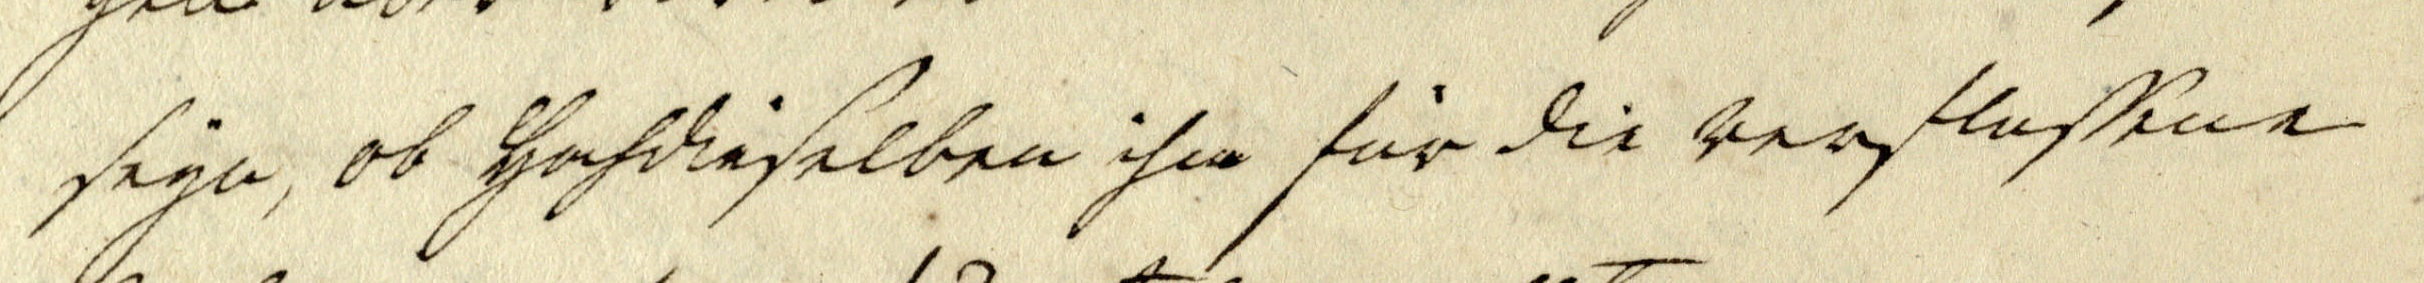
seÿn, ob Hochdieselben ihm für die verflossene
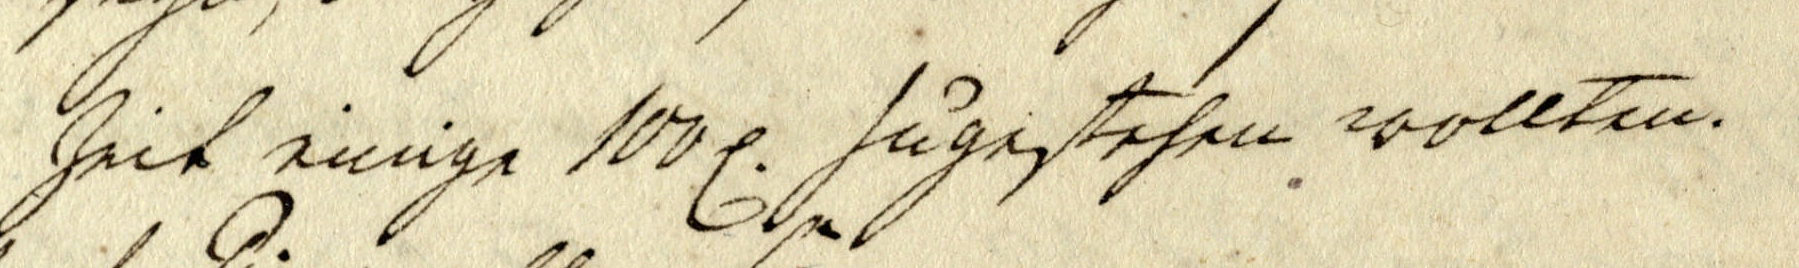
Zeit einge 100 l. zugestehen wollten.
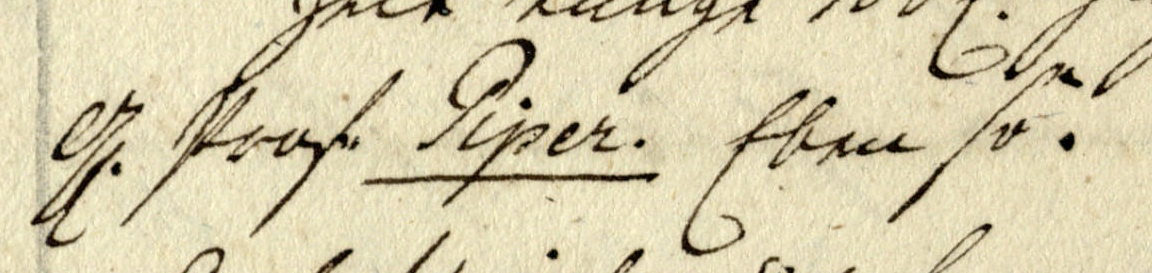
dh. Prof. Piper. Eben so.
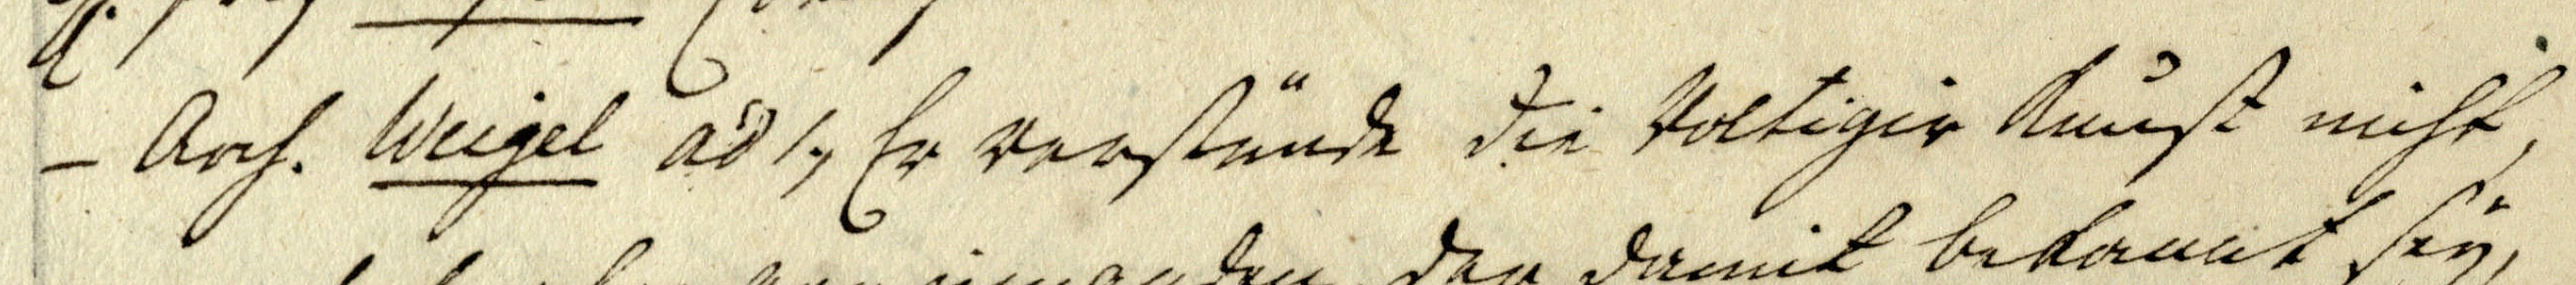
Arch. Weigel ad 1., Er verstünde die Voltigir Kunst nicht,
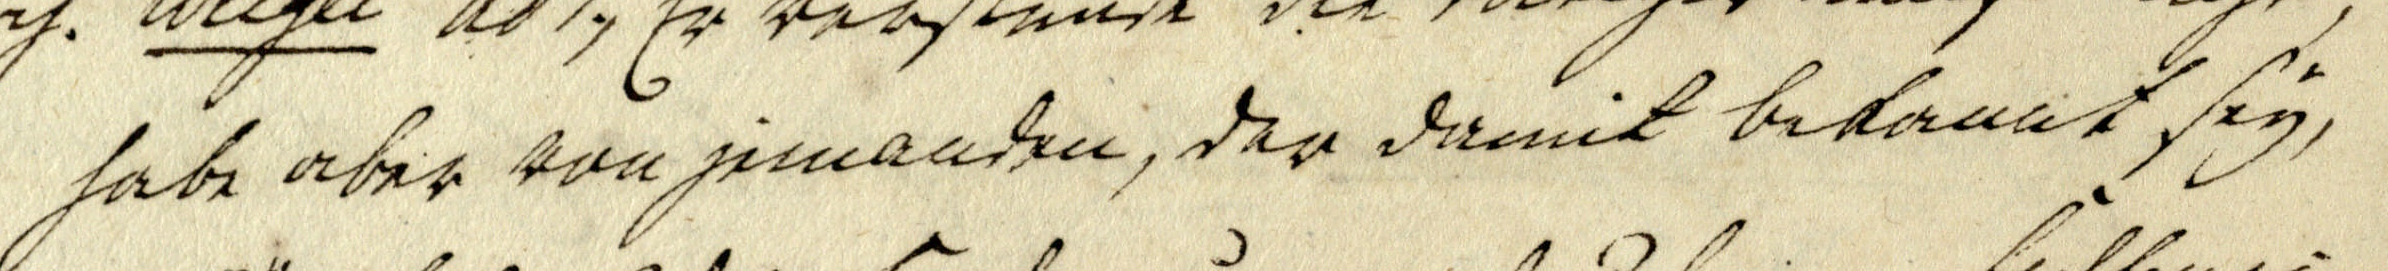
habe aber von jemanden, der damit bekannt seÿ,
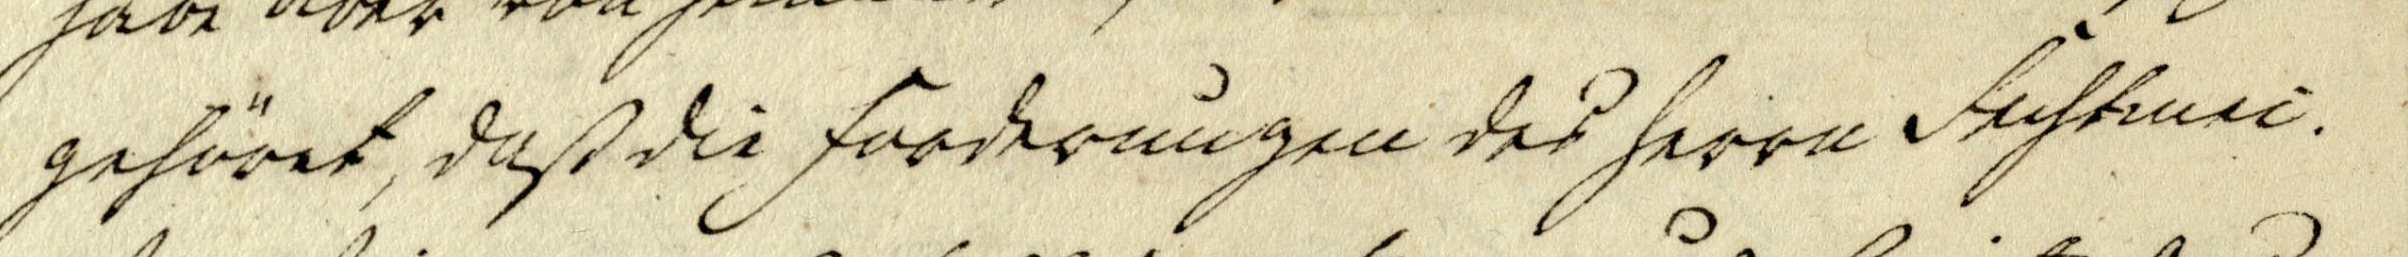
gehöret, daß die Forderungen des Herrn Fechtmei¬
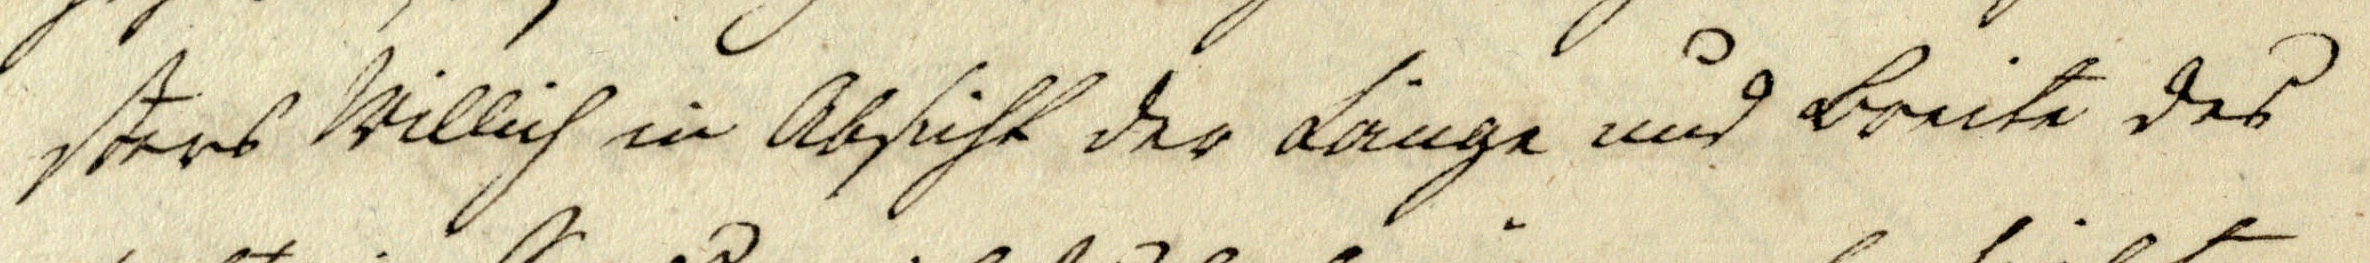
sters Willich in Absicht der Länge und Breite des
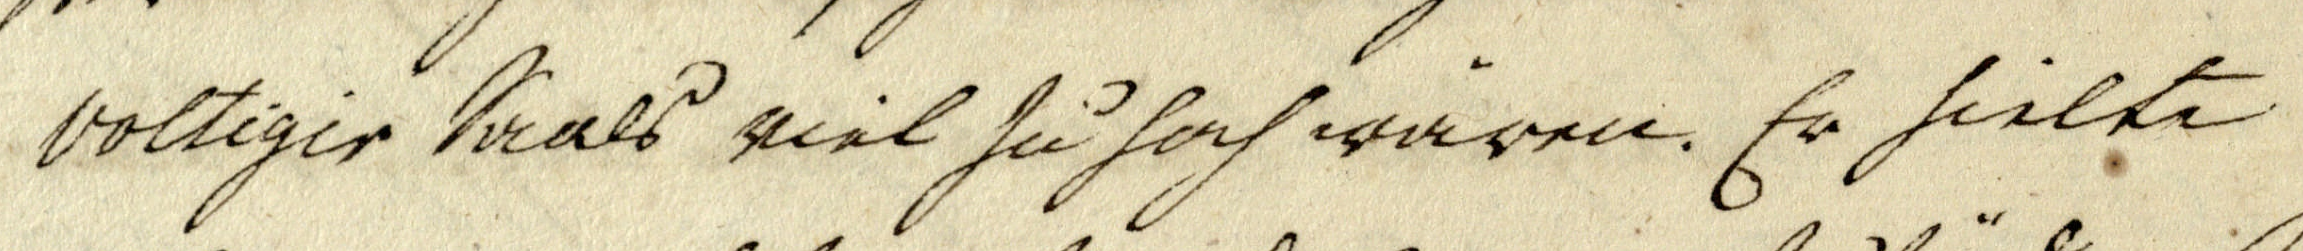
Voltigir Saals viel zu hoch wären. Er hielte
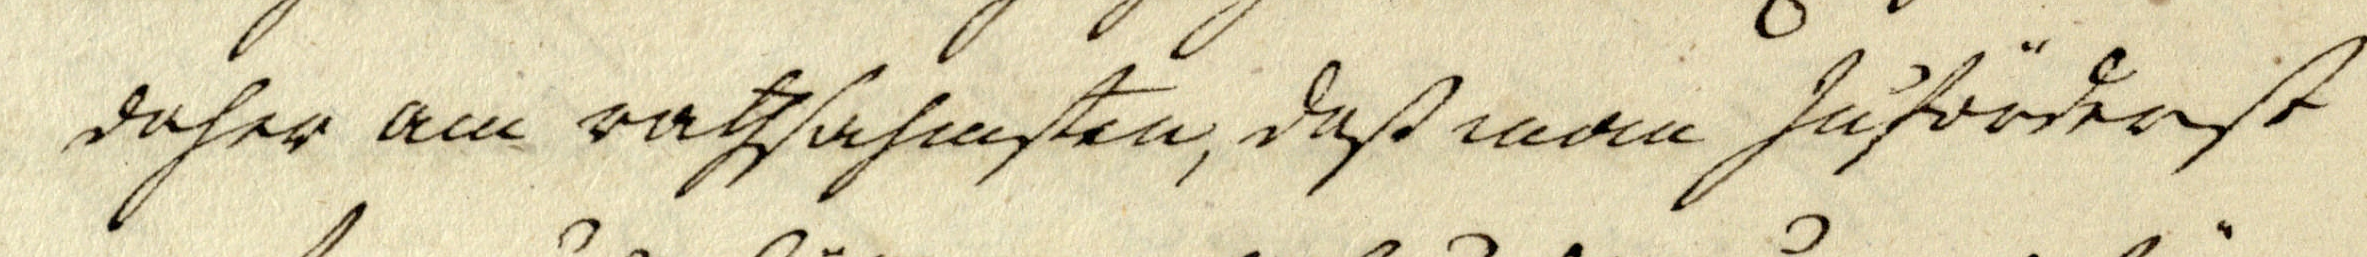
daher am rathsahmsten, daß man zuförderst
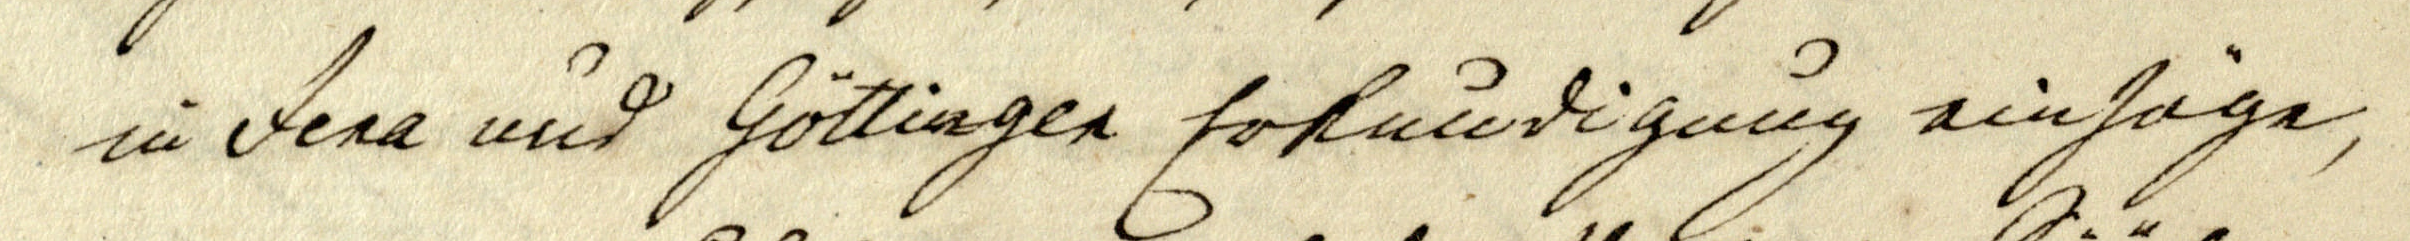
in Jena und Golliagee Erkundigung einzöge,
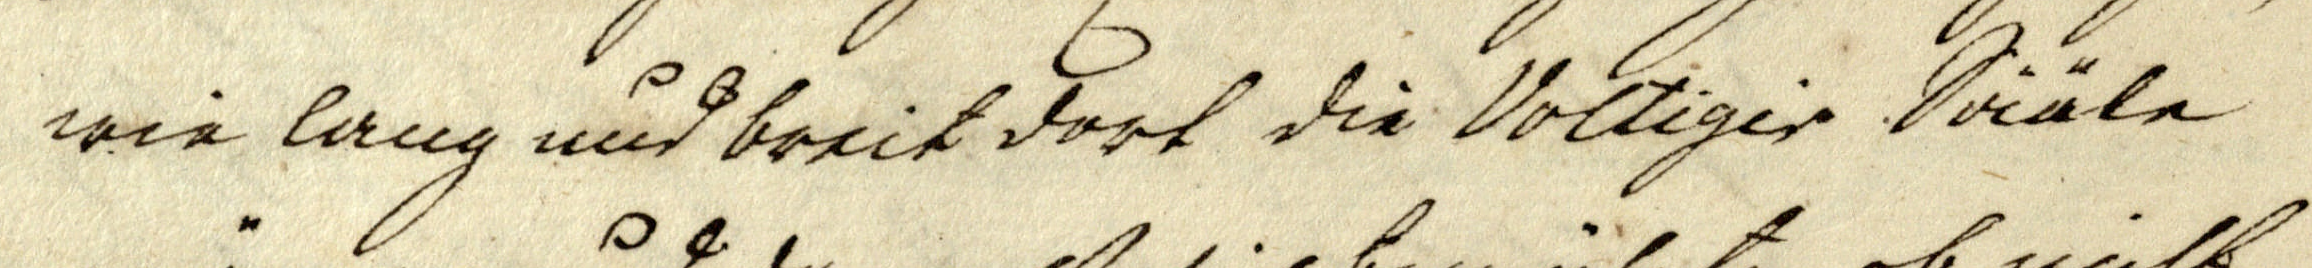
wie lang und breit dort die Voltigir Sääle
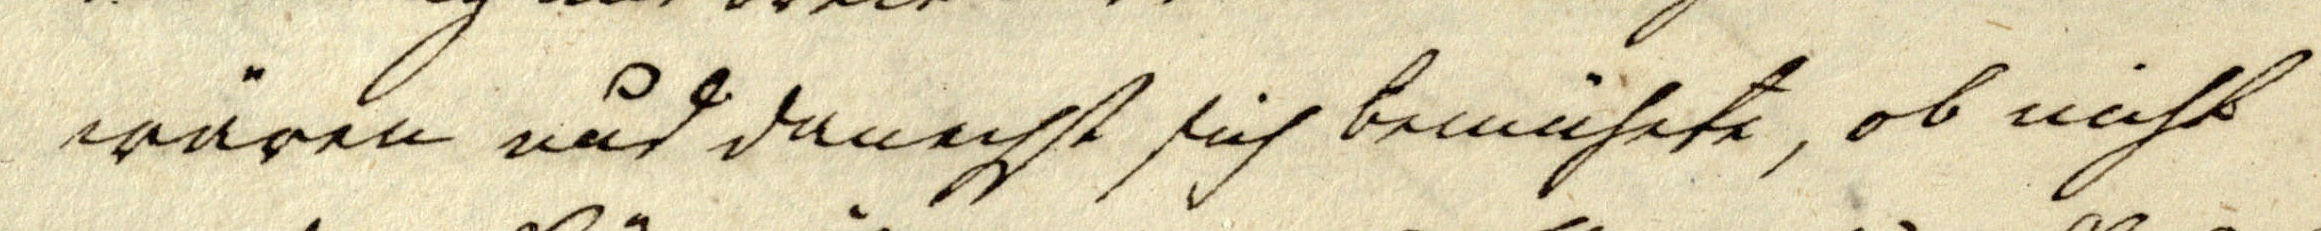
wären und danechst sich bemühete, ob nicht
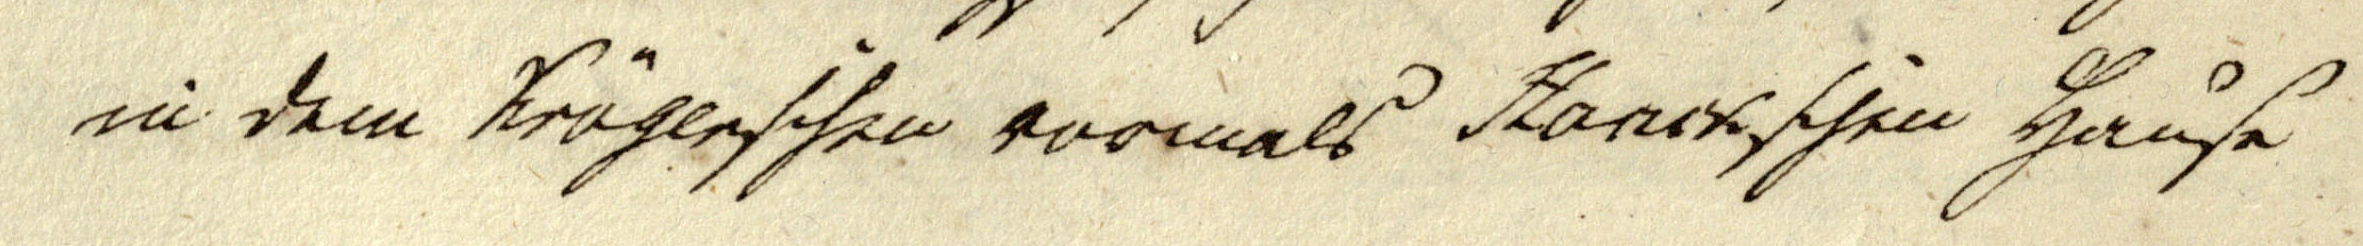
in dem Krögerschen vormals Hanckschen Hause
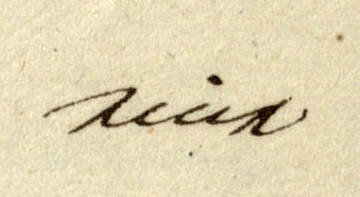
eine
